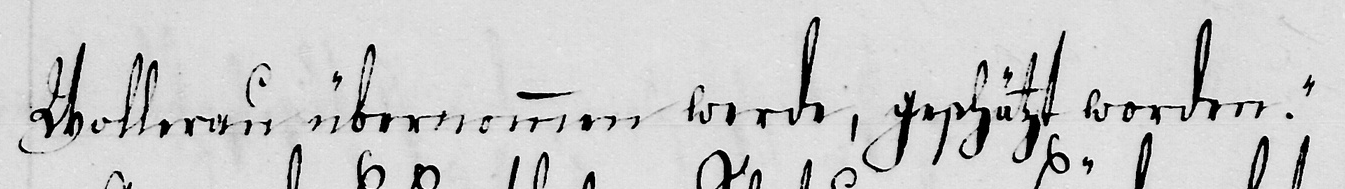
Wollerau übernommen werde, geschätzt worden.“
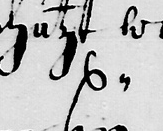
auß¬
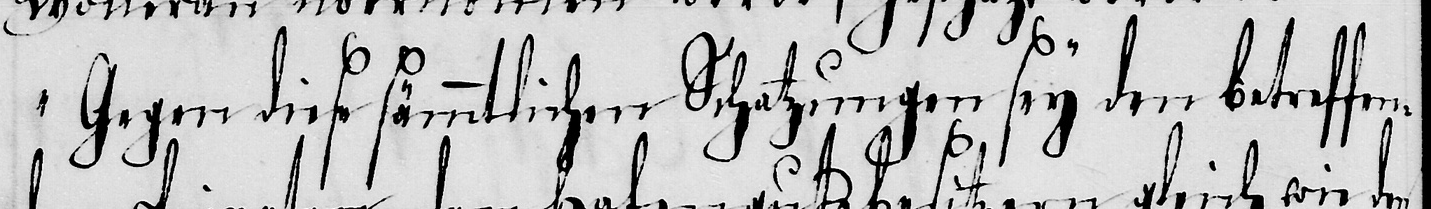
diese sämmtlichen Schatzungen sey den betref¬
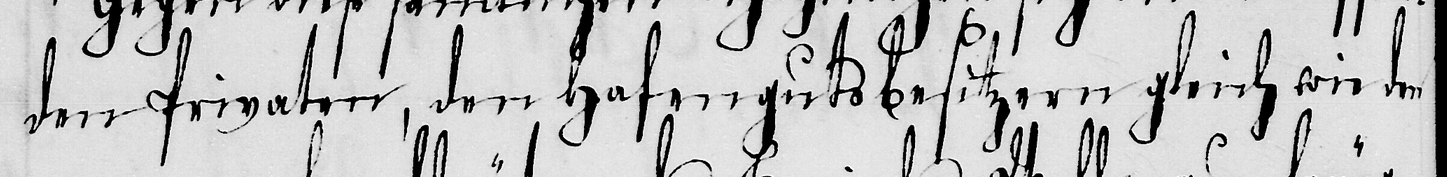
den Privaten, den Hafengutsbesitzern gleich wie den
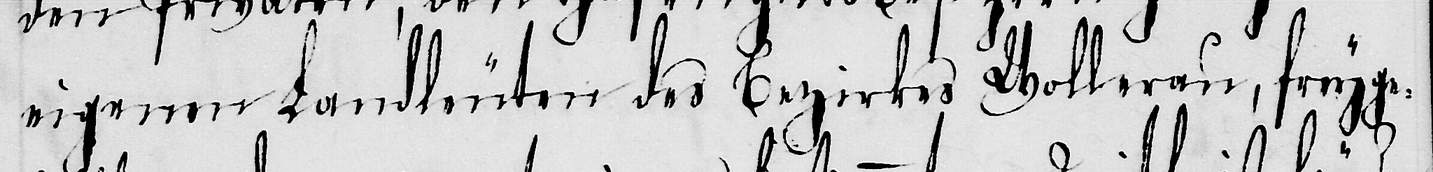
eigenen Landleuten des Bezirkes Wollerau, freyge¬
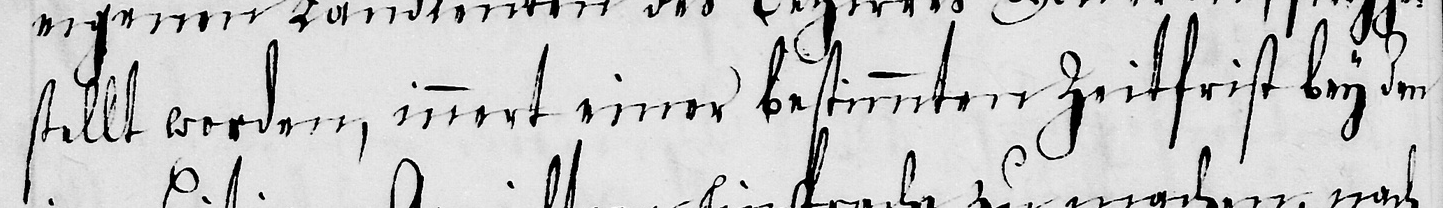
stellt worden, innert einer bestimmten Zeitfrist bey den
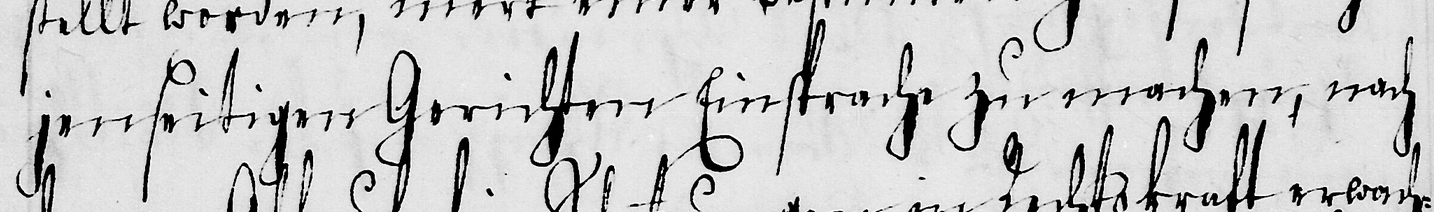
jenseitigen Gerichten Einsprache zu machen, nach
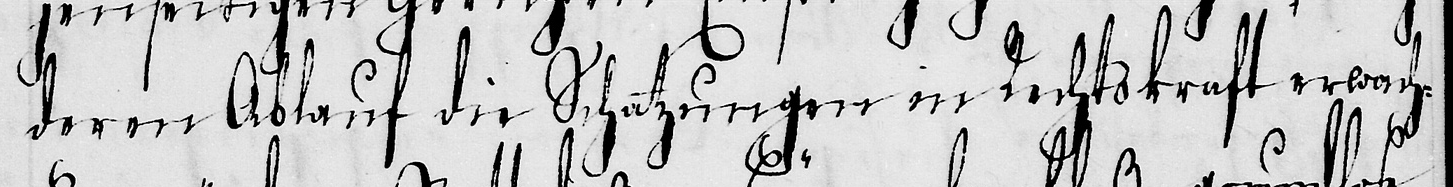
deren Ablauf die Schatzungen in Rechtskraft erwach¬
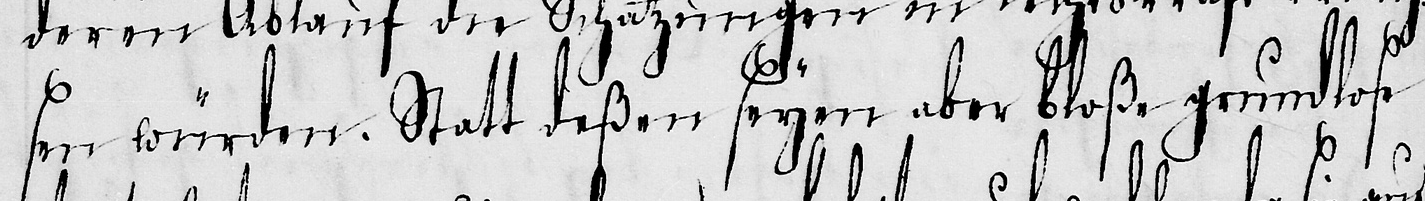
sen würden. Statt deßen seyen aber bloße grundlose
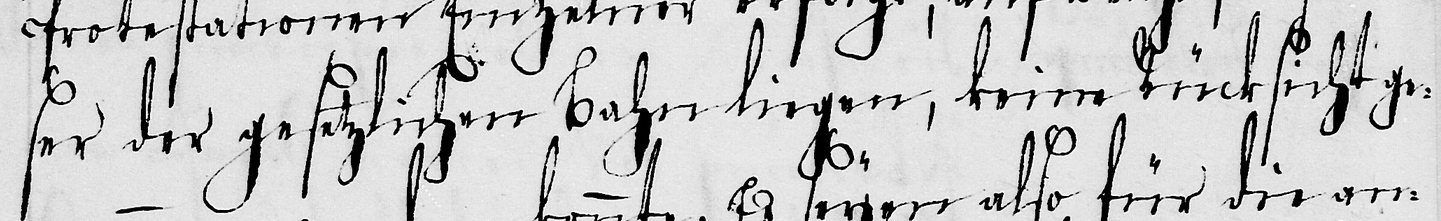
er der gesetzlichen Bahn liegen, keine Rücksicht g¬
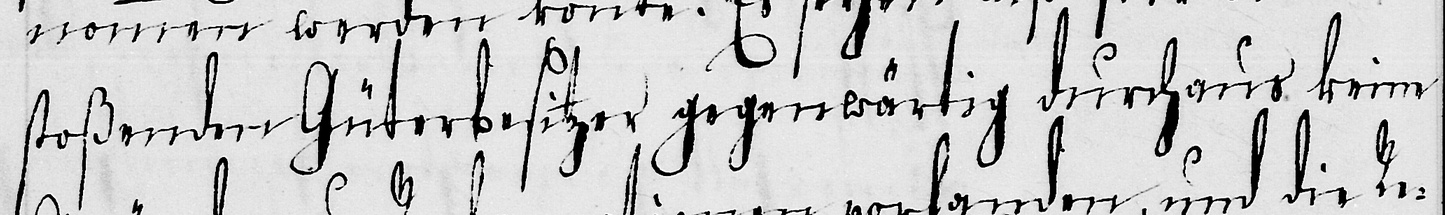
stoßenden Güterbesitzer gegenwärtig durchaus keine
